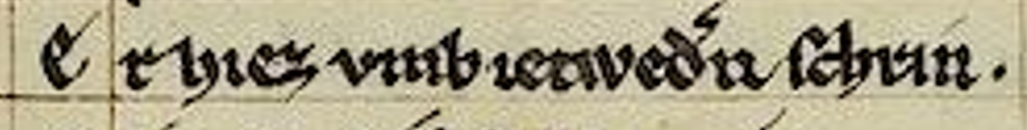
Er hiez vmb ietwed(er)n ſchrin.
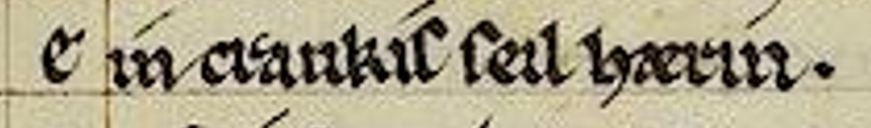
Ein crankiſ ſeil h[ae]rin.
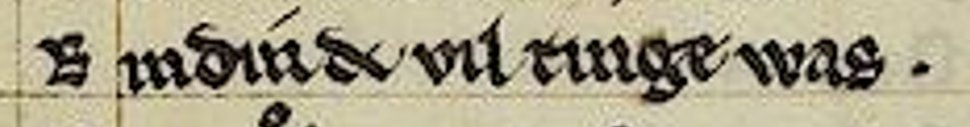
Bindin d(az) vil ringe was.
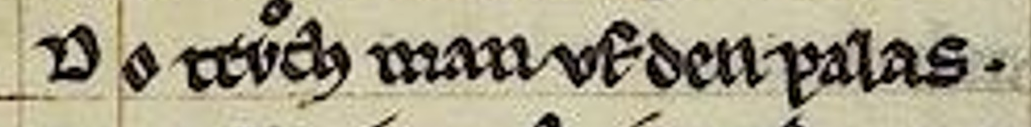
Do trv°och man vf den palas.
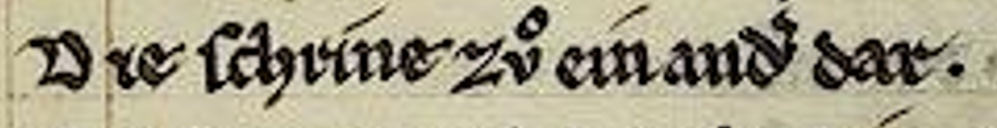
Die ſchrine zv°o ein and(er) dar.
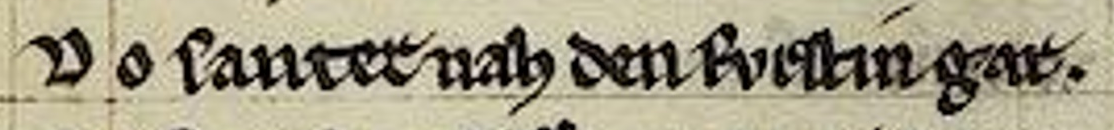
Do ſante er nah den fvrſtin gar.
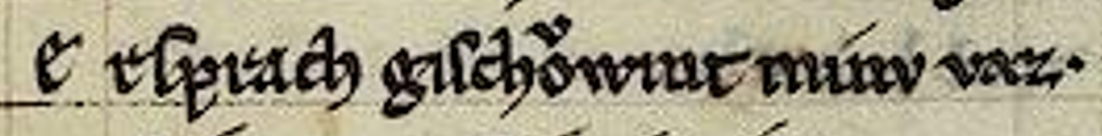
Er ſprach giſcho°vwint minv vaz.
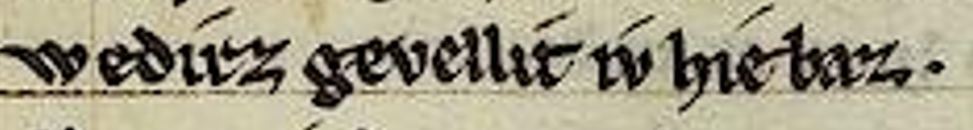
Wedirz gevellit iv hie baz.
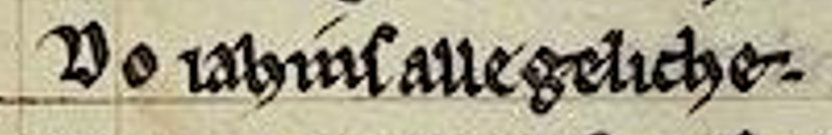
Do iahinſ alle geliche.
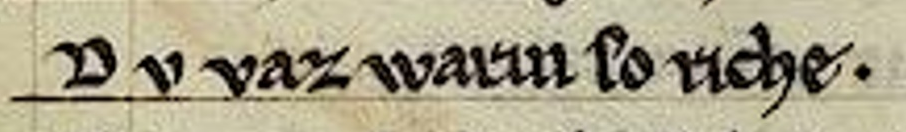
Dv vaz warin ſo riche.
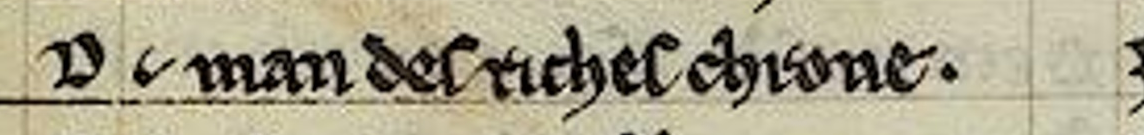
D(az) man deſ richeſ chrone.
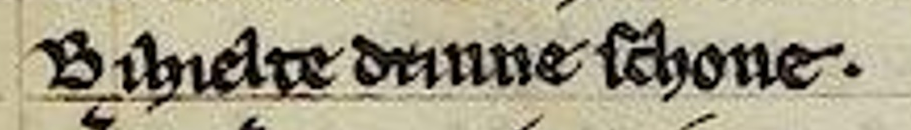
Bihielte drinne ſchone.
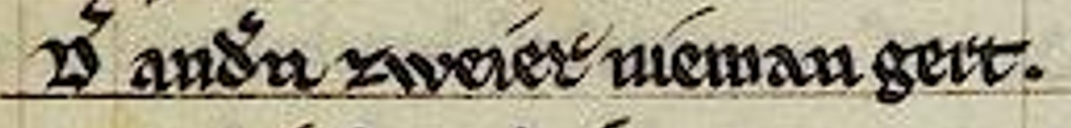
D(er) and(er)n zweier nieman gert.
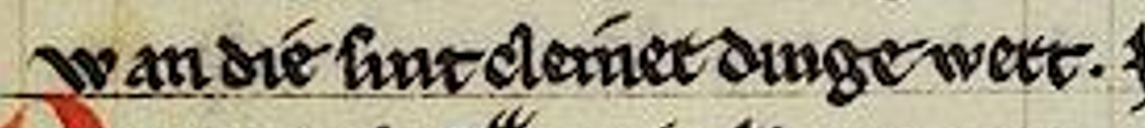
Wan die ſint cleiner dinge wert.
